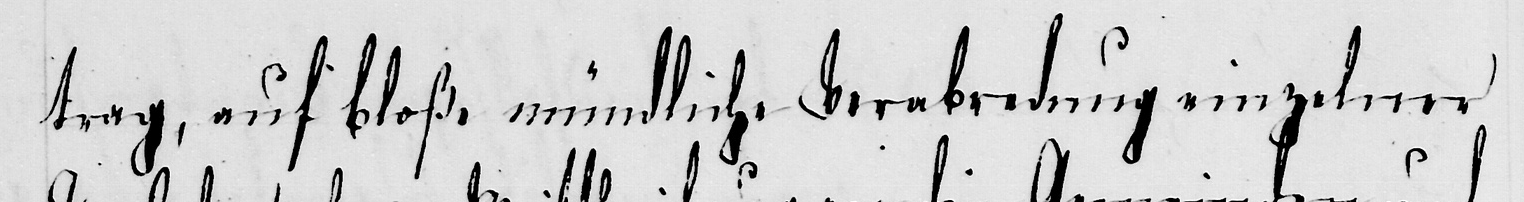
trag, auf bloße mündliche Verabredung einzelner
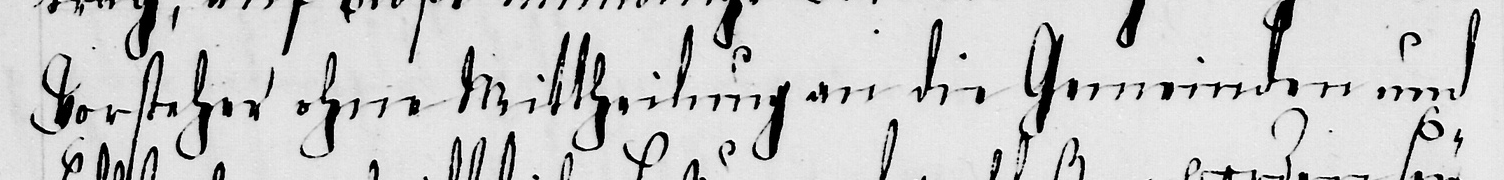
Vorsteher ohne Mittheilung an die Gemeinden und
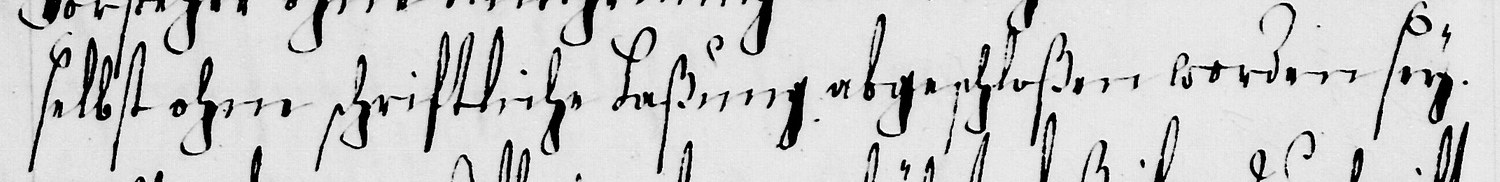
selbst ohne schriftliche Faßung abgeschloßen worden sey.
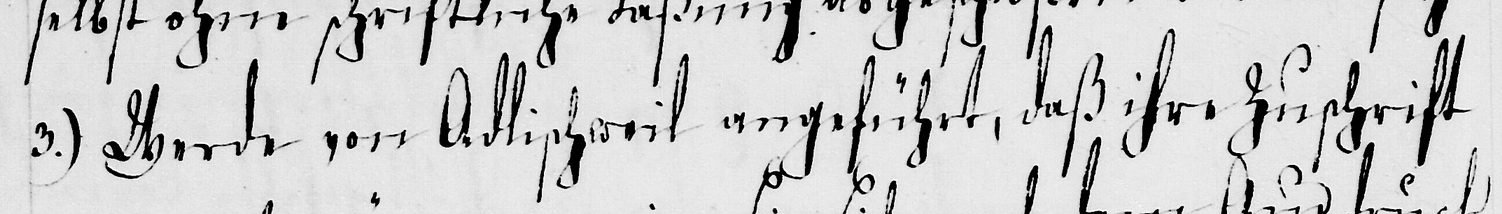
3.) Werde von Adlischweil angeführt, daß ihre Zuschrift
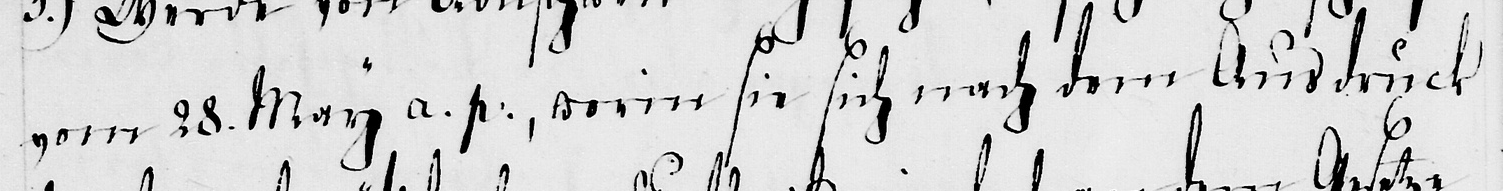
vom 28. May a. p., worin sie sich nach dem Ausdruck
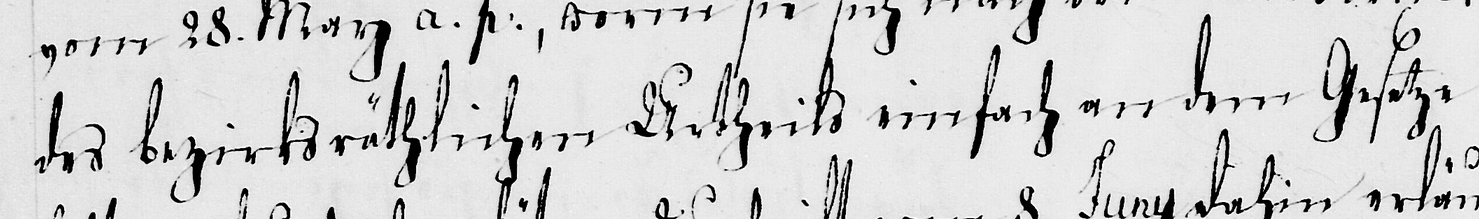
des bezirksräthlichen Urtheils einfach an dem Gesetze
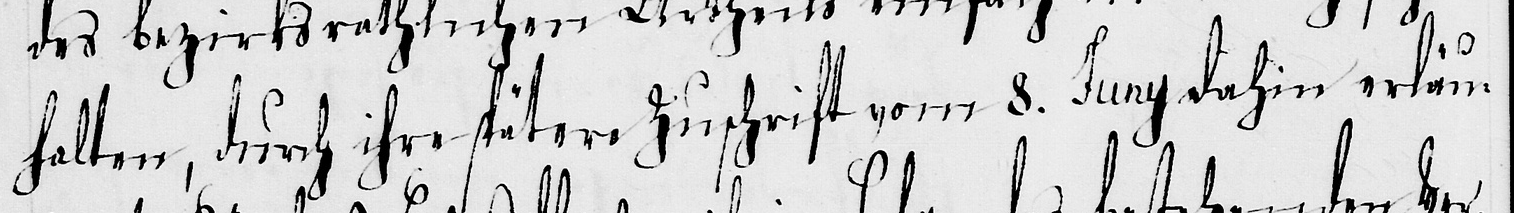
halten, durch ihre spätere Zuschrift vom 8. Juny dahin erläu¬
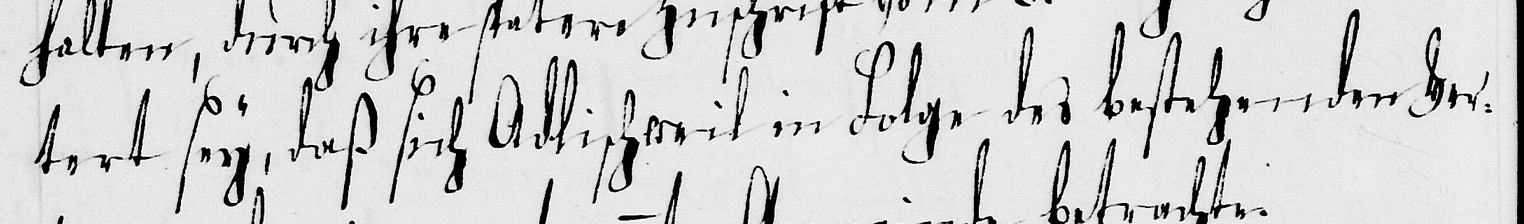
tert sey, daß sich Adlischweil in Folge des bestehenden Ver¬
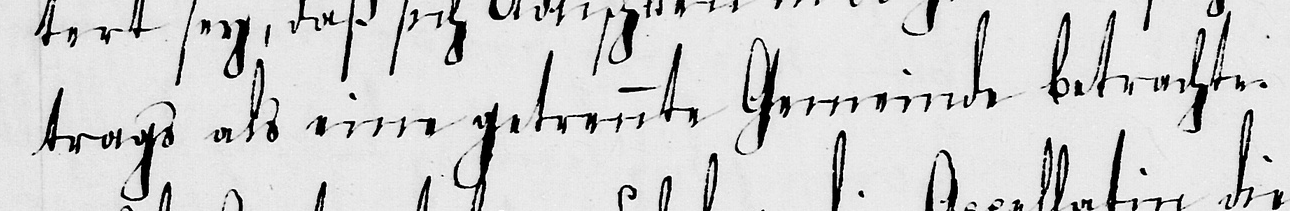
trags als eine getrennte Gemeinde betrachte.
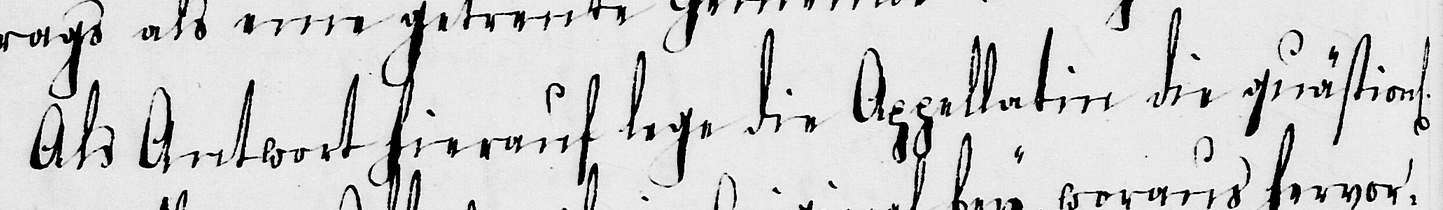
Als Antwort hierauf lege die Appellatin die quästio¬
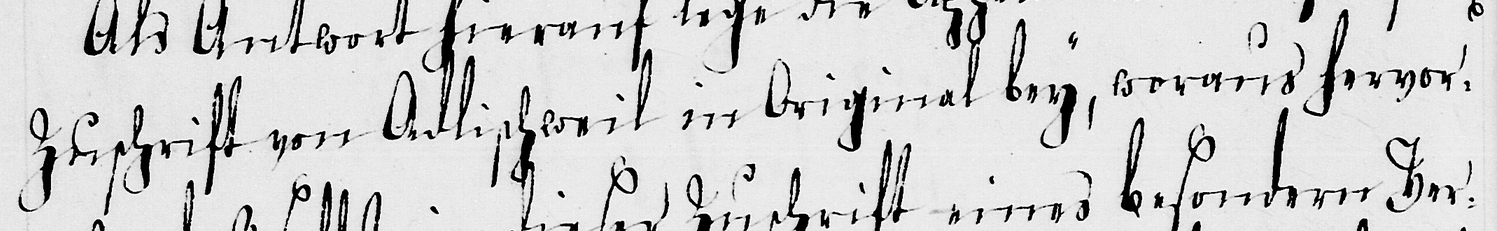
Zuschrift von Adlischweil in Original bey, woraus hervor¬
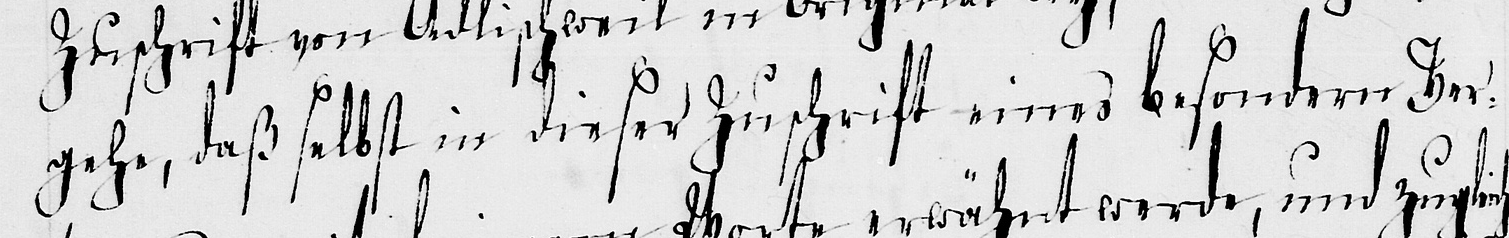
gehe, daß selbst in dieser Zuschrift eines besondern Ver¬
